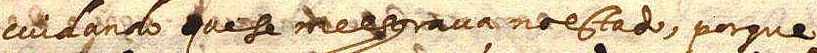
e cuidando que se melhoraua no estado, porque
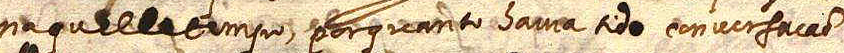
naquelle tempo, porquanto hauia tido conuersacaõ
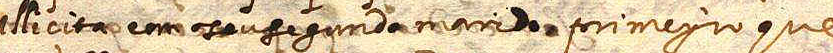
illicita com o seu segundo marido primejro que
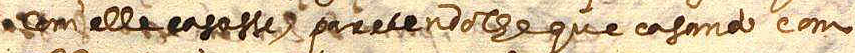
com elle casasse, parecendolhe que casando com
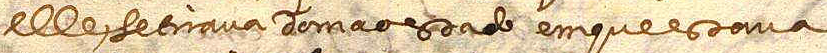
elle, se tiraua do mao estado em que estaua
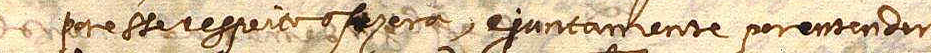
por esse respeito o fezera, e juntamente por entender
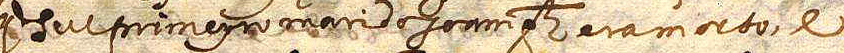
q̄ seu primeyro marido Joam gl̄z era morto, e
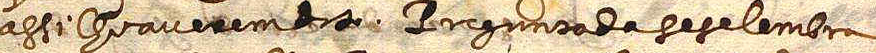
assi lho auerem dito. Preguntada se se lembra
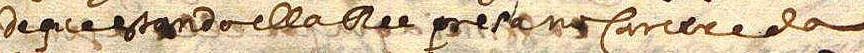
de que estando ella Ree presa no Carcere da
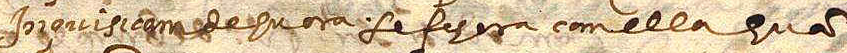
Jnquisicam de Euora. se fezera com ella huā
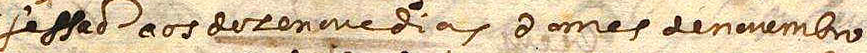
sessaõ aos dezenoue dias do mes de nouembro
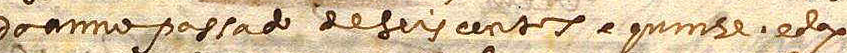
do anno passado de seiscentos e quinze. e das
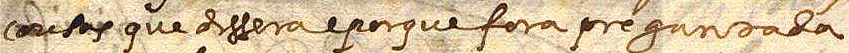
cousas que dissera e porque fora preguntada
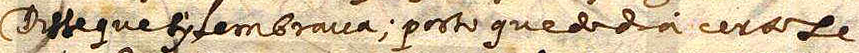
Disse que sy lembraua; posto que do dia certo se
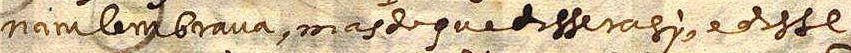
nam lembraua, mas do que dissera sy, e disse
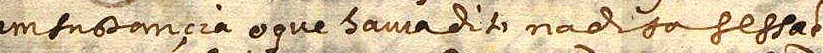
em sustançia o que hauia dito na dita sessaõ
